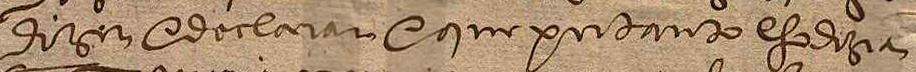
dizer e declarar e que portanto lho dizia
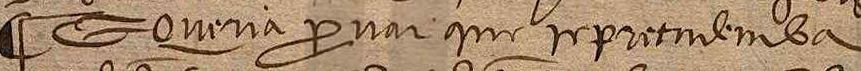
¶ E Queria ꝓuar que repreendendoa
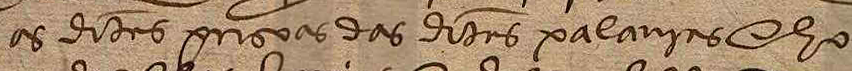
as ditas persoas das ditas palauras e ho
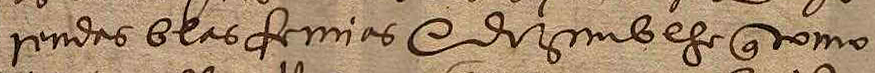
rendas blasfemias e dizemdo lhe q̄ como
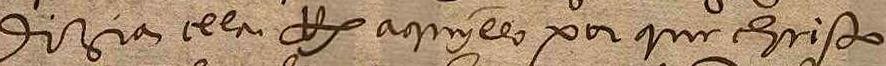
dizia ella Rꝭ aquyllo porque christo
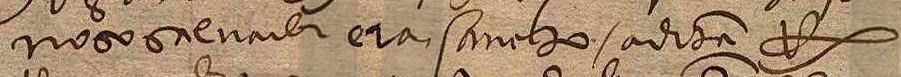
noso saluador era sancto / a dita Rꝭ
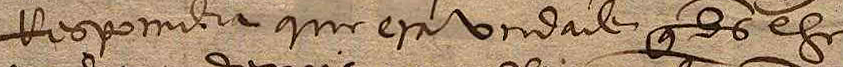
Respomdera que era verdade q̄ ds̄ lhe
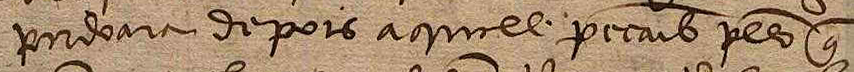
perdoara depois aquelle pecādo pl̄lo q̄
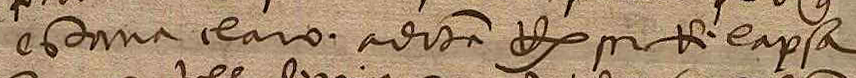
estaua claro a dita Rꝭ ser Relapsa
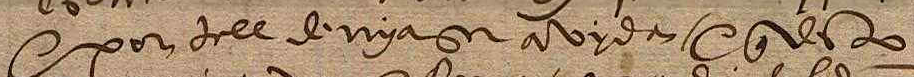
e por tall deuya ser avyda / e q̄ desto
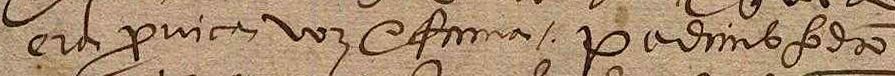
era ꝓuica voz e fama /. Pedindo ho dt̄o
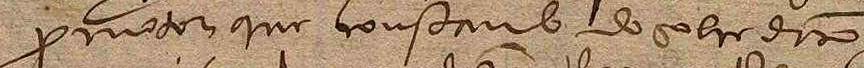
ꝓmotor que constando do sobredito
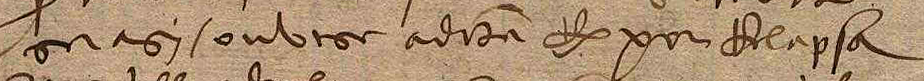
ser asy / ouvese a dita Rꝭ por Relapsa
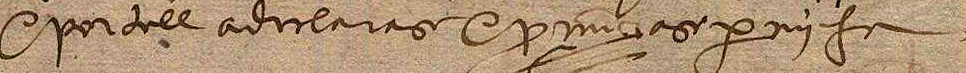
e por tall a declarase e ꝓnūciase ꝑ mjnha
